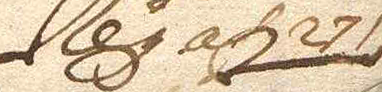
Reg.da a fL 271
